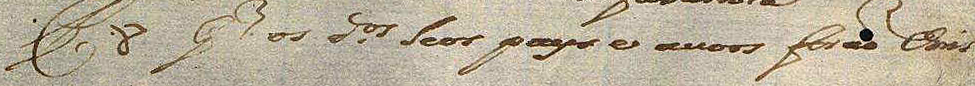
P. 8 Q̄ os d.os seos pays e auoos foraõ chris
